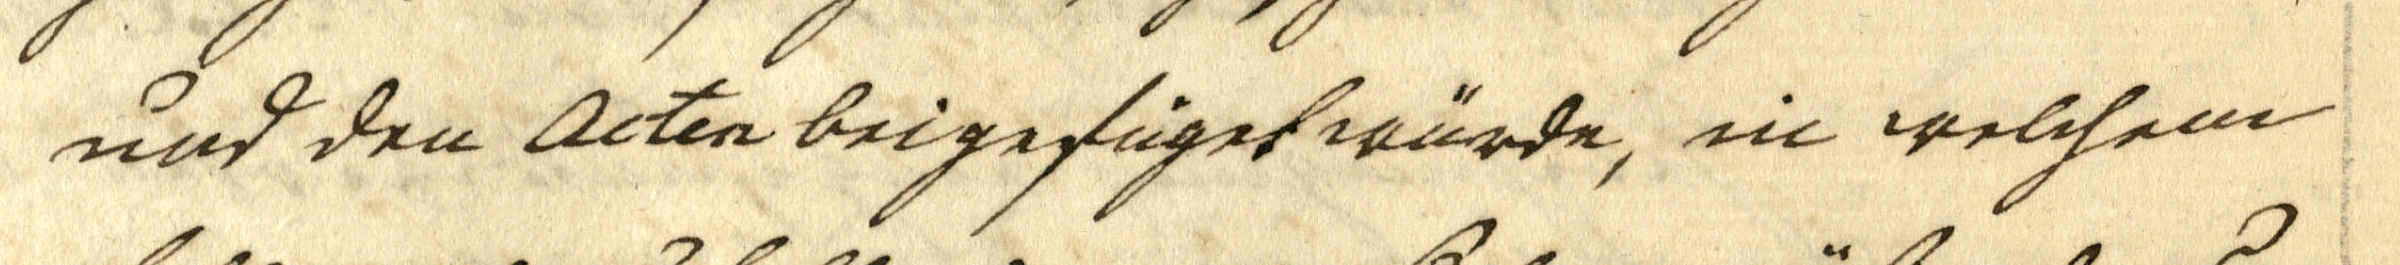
und den Acten beigefüget würde, in welchem
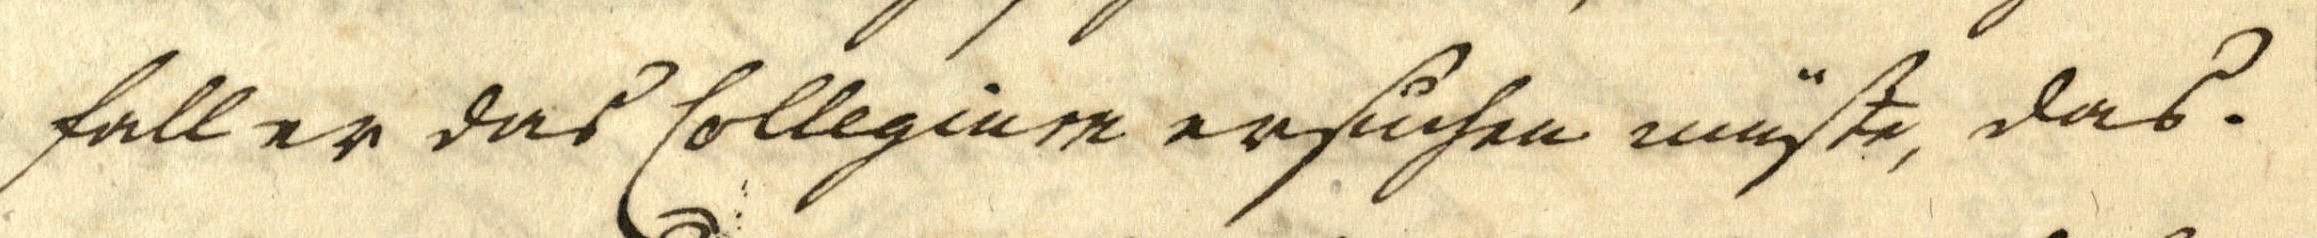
Fall er das Collegium ersuchen müßte, das¬
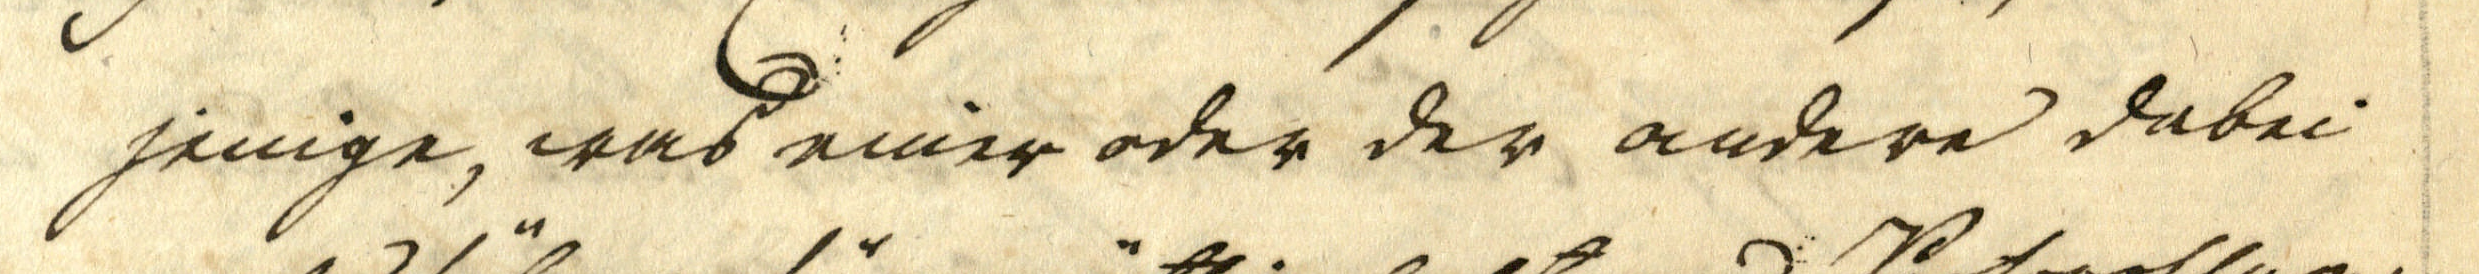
jenige, was einer oder der andere dabei
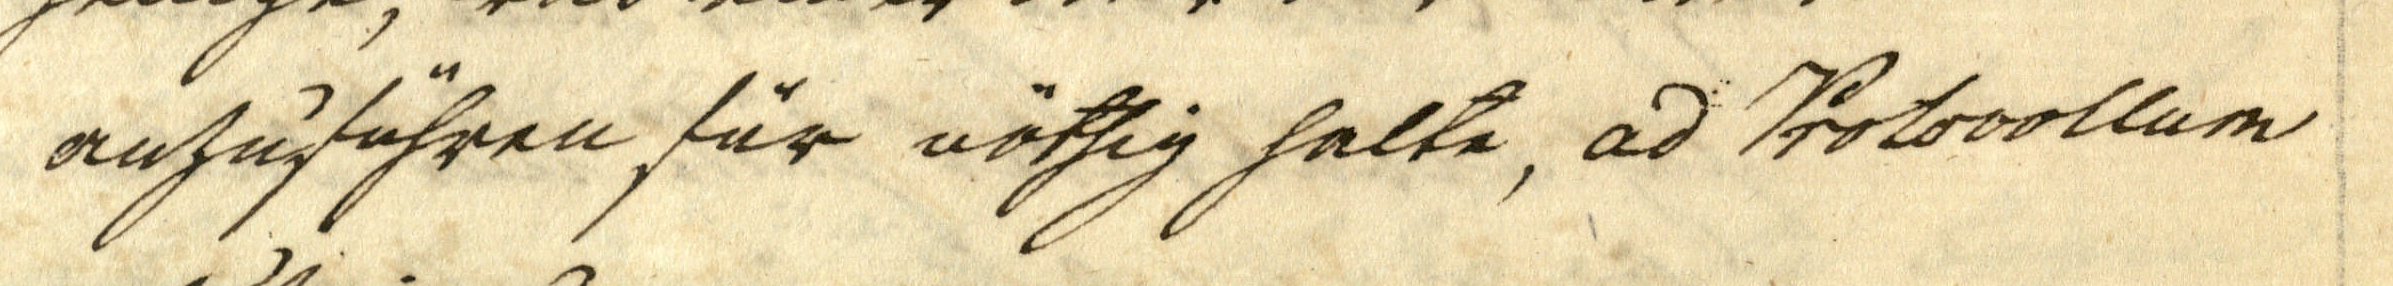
anzuführen für nöthig halte, ad Protocollum
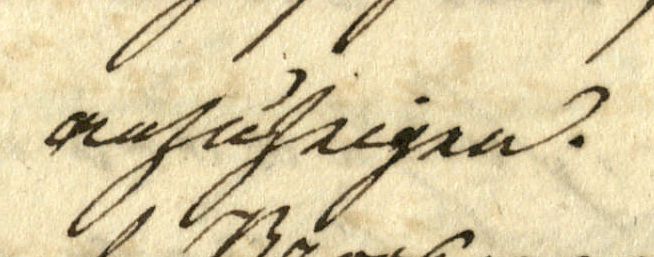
anzuzeigen.
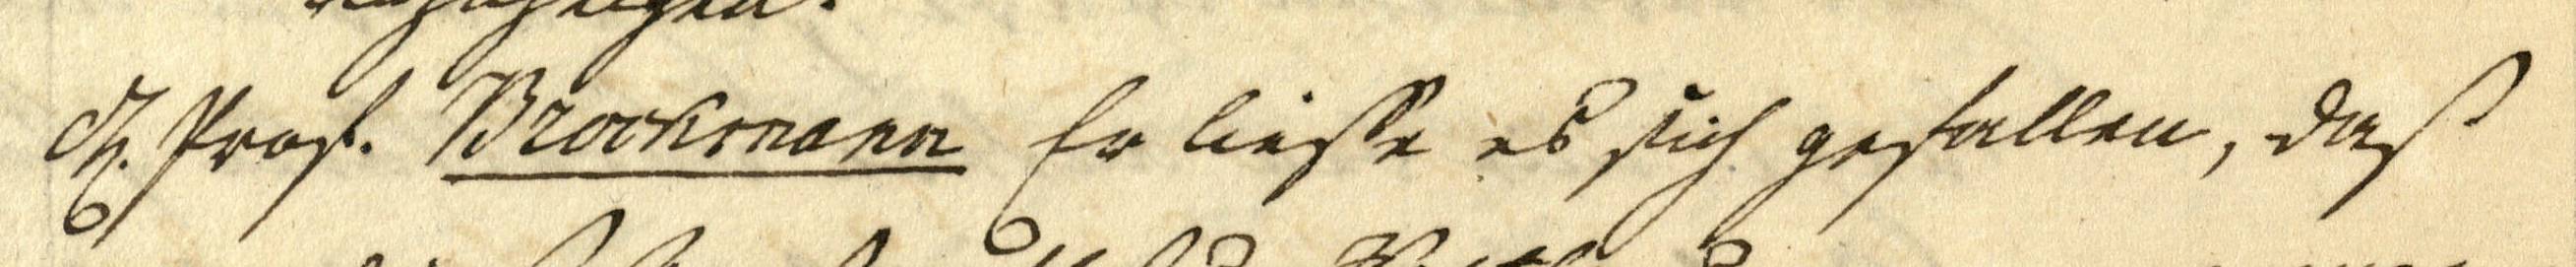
dh. Prof. Brockmann Er liesse es sich gefallen, daß
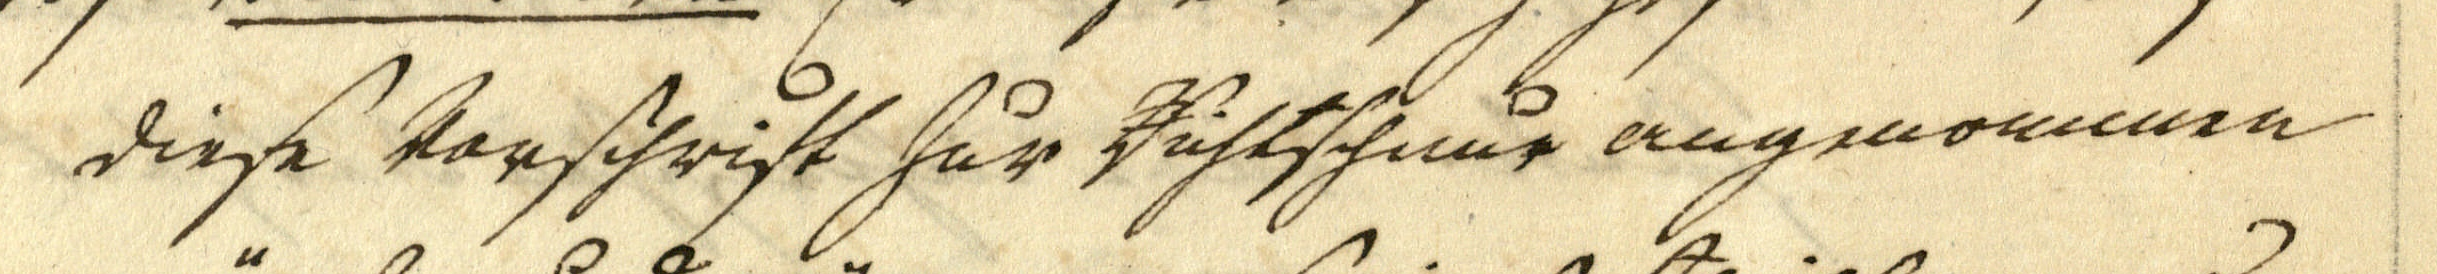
diese Vorschrift zur Richtschnur angenommen
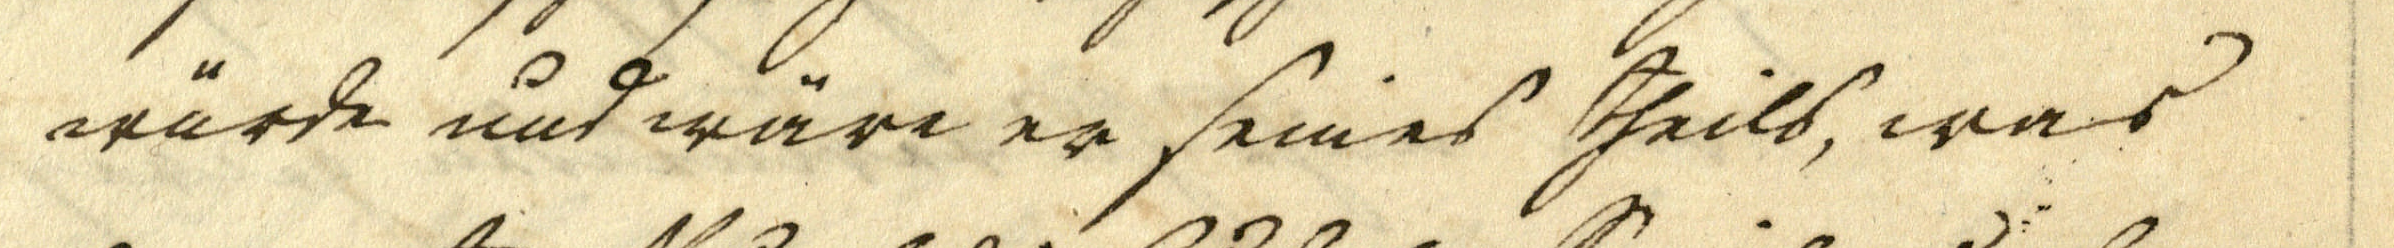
würde und wäre er seines Theils, was
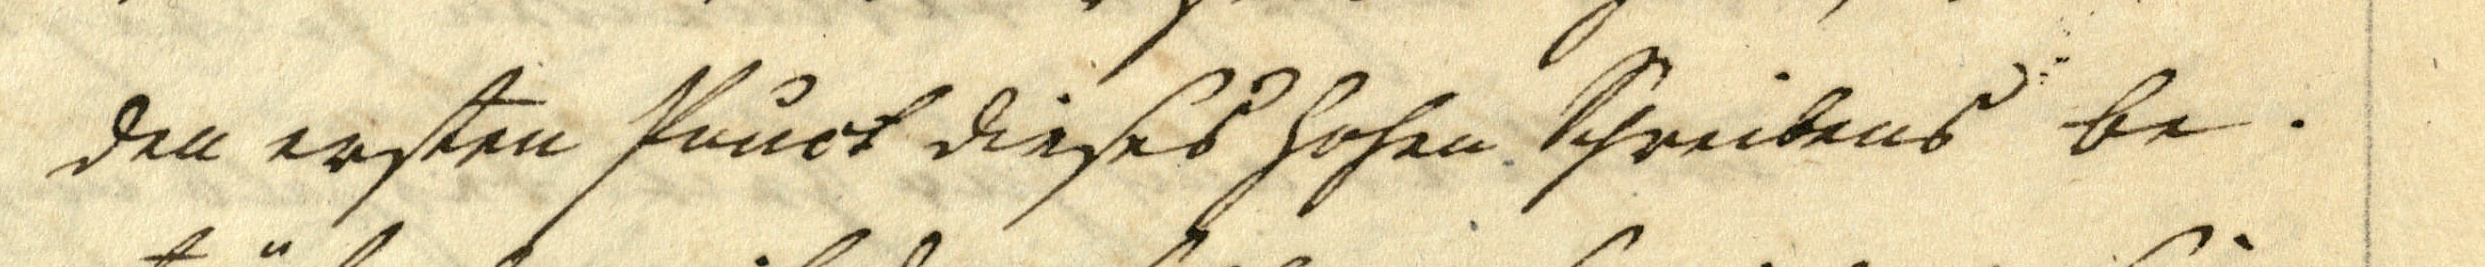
den ersten Punct dieses hohen Schreibens be¬
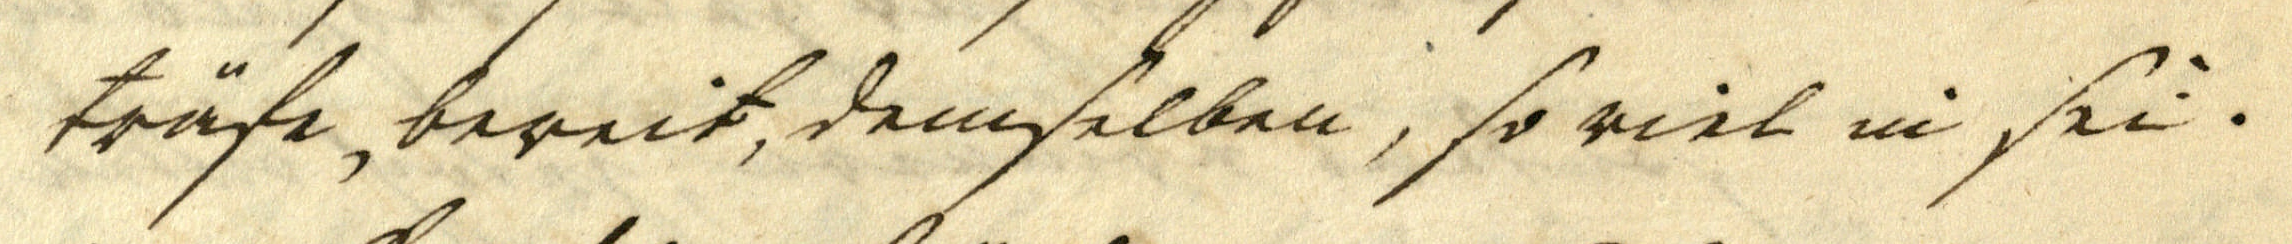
träfe bereit, demselben, so viel in sei¬
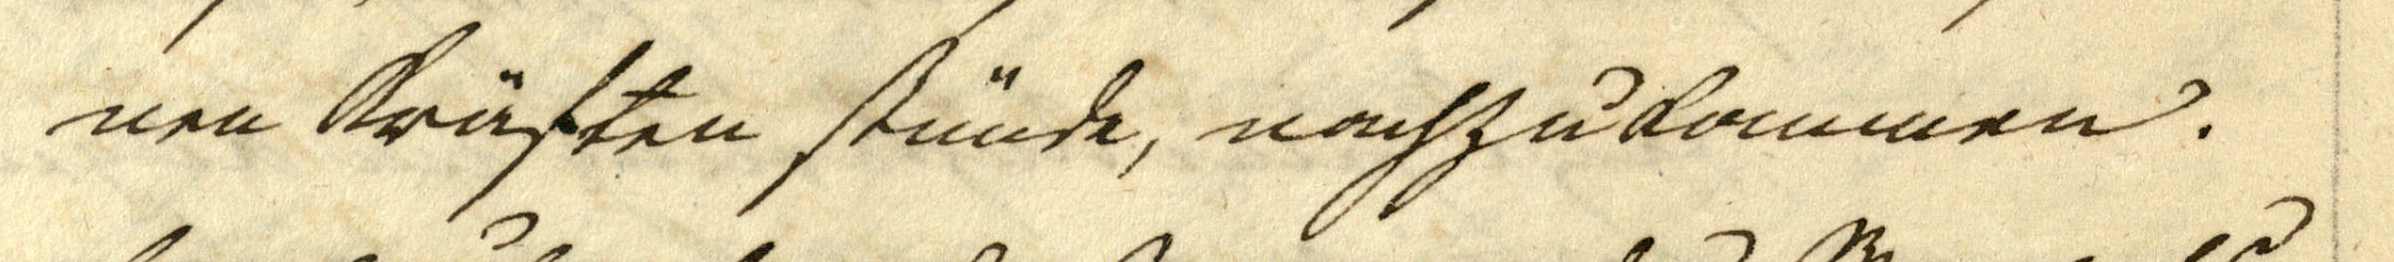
nen Kräften stünde, nachzukommen.
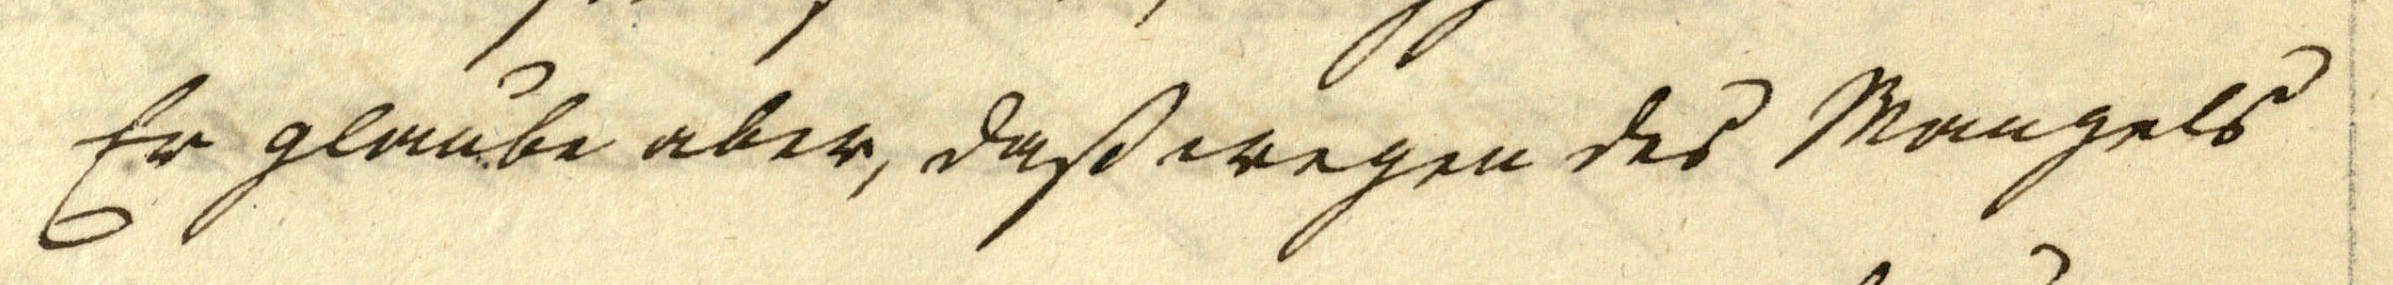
Er glaube aber, daß wegen des Mangels
